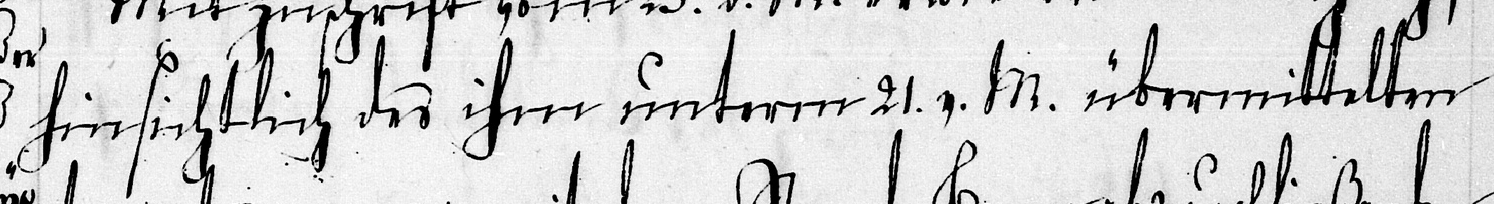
hinsichtlich des ihm unterm 21. v. M. übermittelten
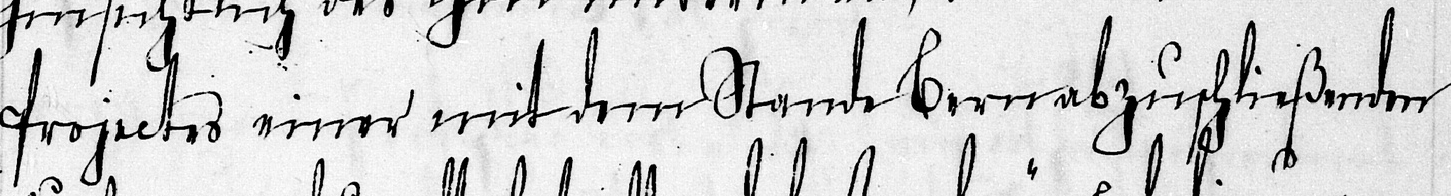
Projectes einer mit dem Stande Bern abzuschließenden
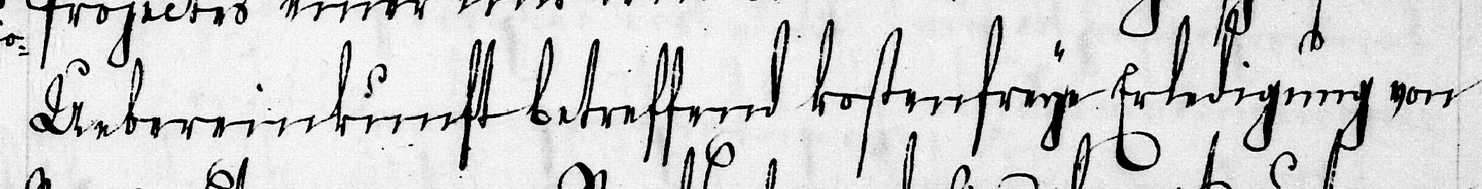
Uebereinkunft betreffend kostenfreye Erledigung von
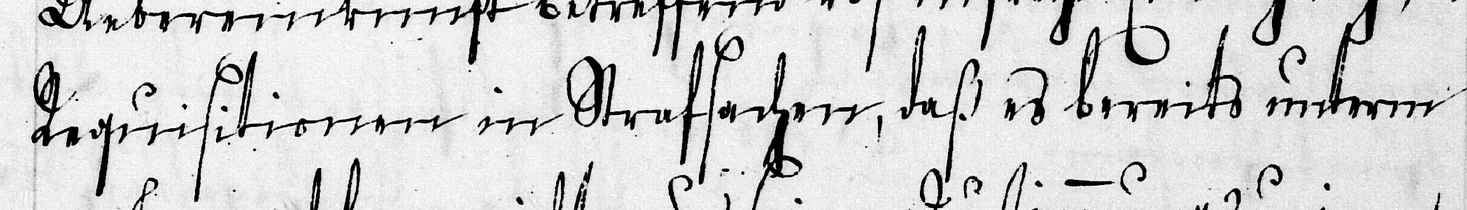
Requisitionen in Strafsachen, daß es bereits unterm
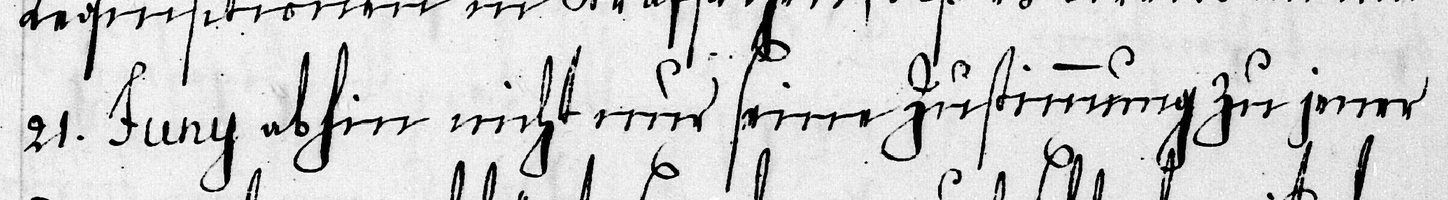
21. Juny abhin nicht nur seine Zustimmung zu jener
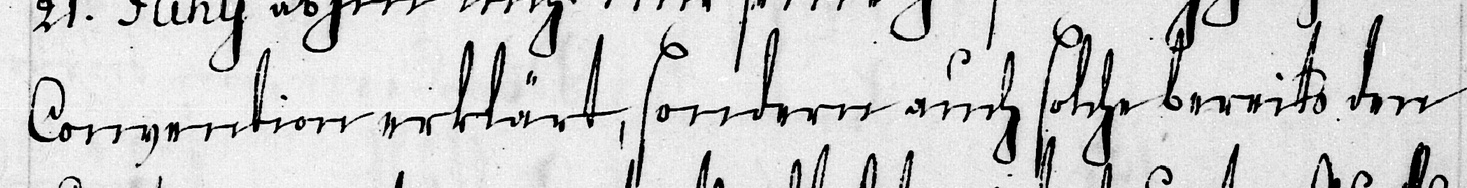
Convention erklärt, sondern auch solche bereits den
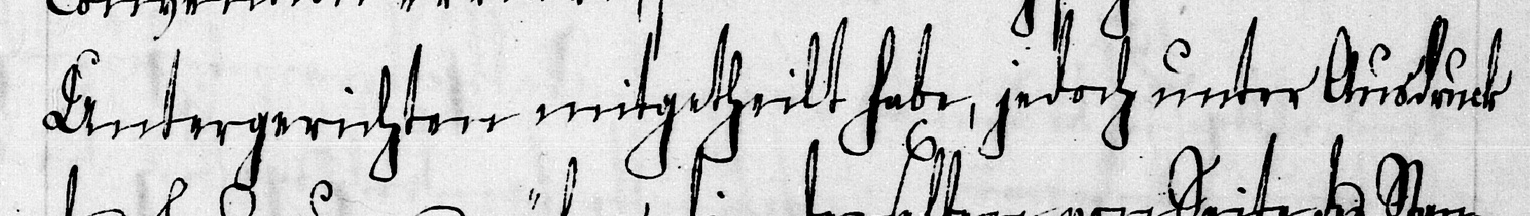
Untergerichten mitgetheilt habe, jedoch unter Ausdruck
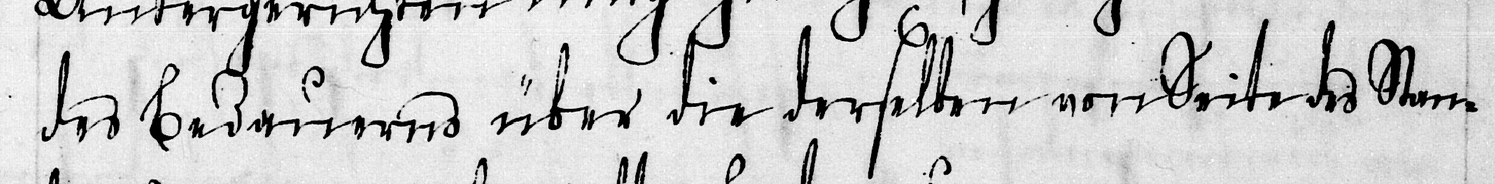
des Bedauerns über die derselben von Seite des Stan¬
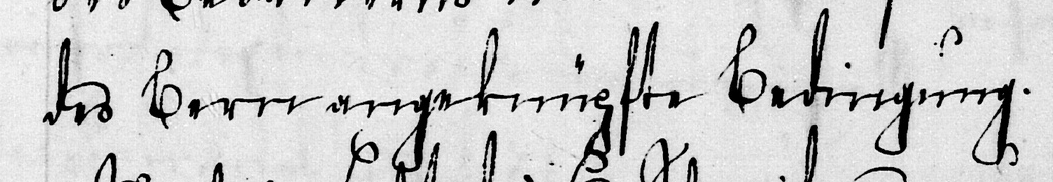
des Bern angeknüpfte Bedingung.
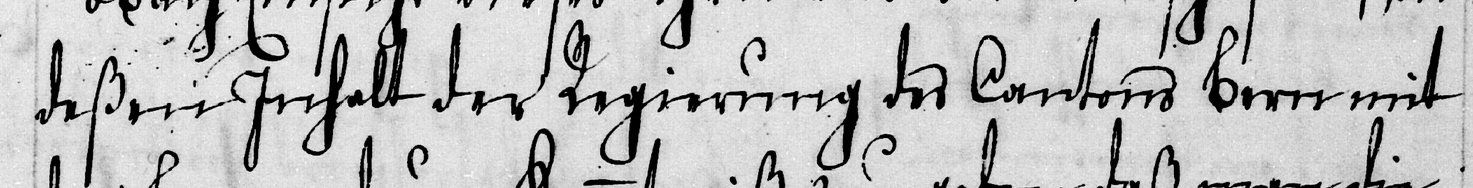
deßen Inhalt der Regierung des Cantons Bern mit
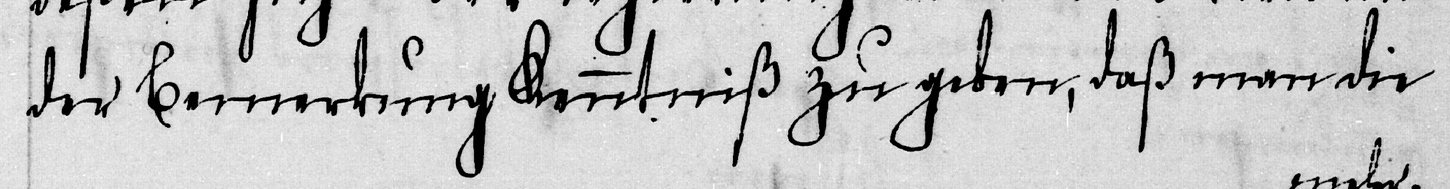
der Bemerkung Kenntniß zu geben, daß man die
